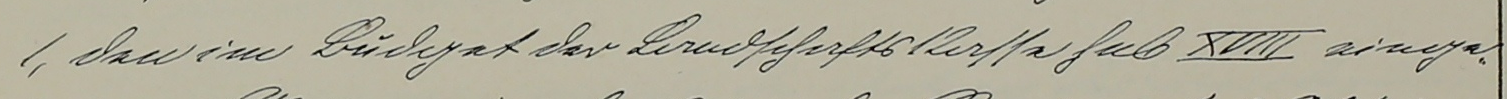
1. den im Budget der Landschaftskasse sub XVIII einge-
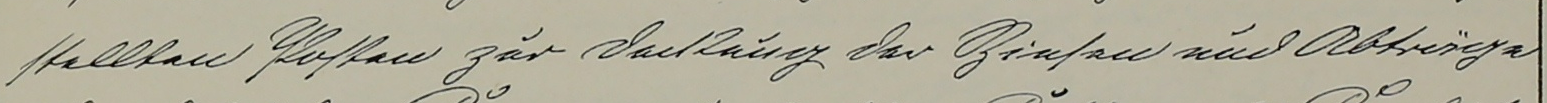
stellten Posten zur Deckung der Zinsen und Abträge
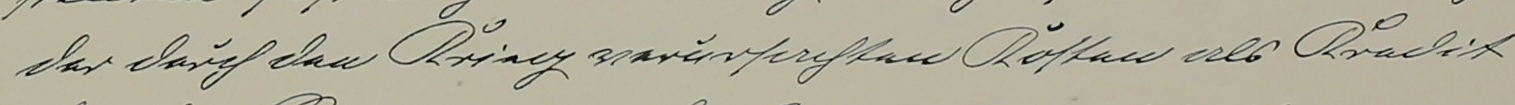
der durch den Krieg verursachten Kosten als Kredit
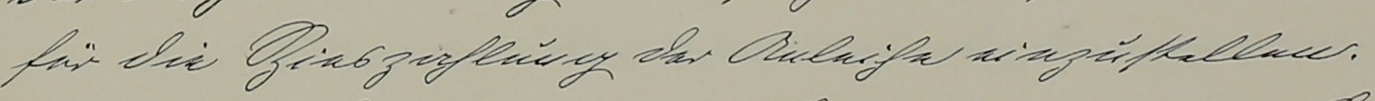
für die Zinszahlung der Anleihe einzustellen.
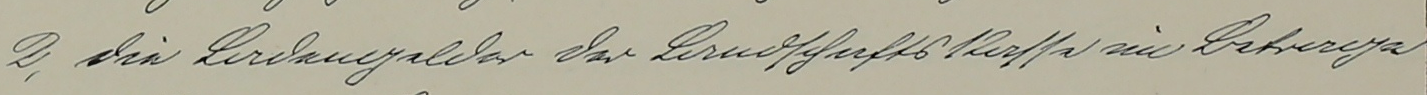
2. die Ladengelder der Landschaftskasse im Betrage
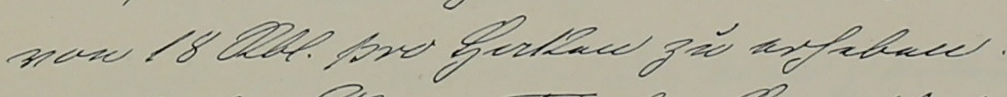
von 18 Rbl. pro Haken zu erheben.
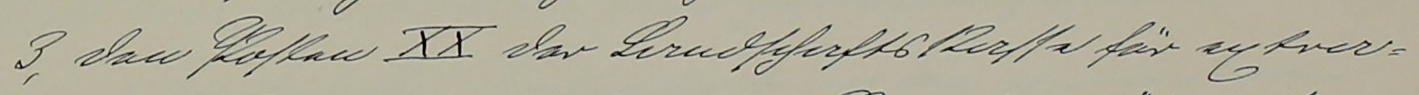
3. den Posten XX der Landschaftskasse für extra-
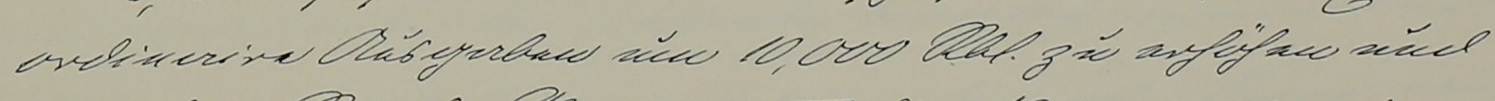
ordinaire Ausgaben um 10.000 Rbl. zu erhöhen und
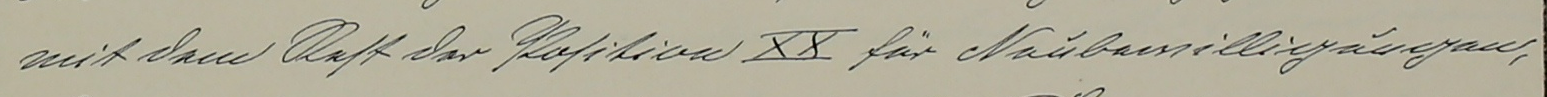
mit dem Rest der Position XX für Neubewilligungen,
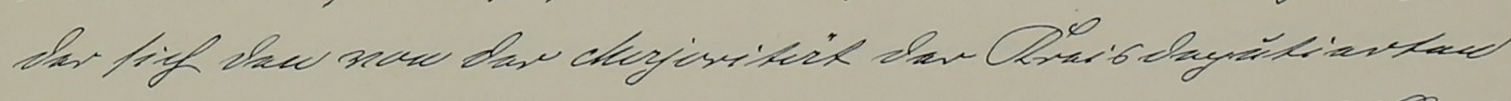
der sich den von der Majorität der Kreisdeputierten
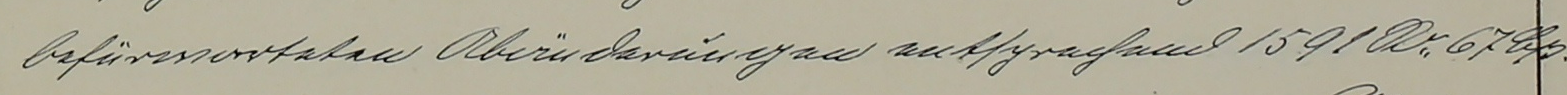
befürworteten Abänderungen entsprechend 1591 Ro. 67 Cop.
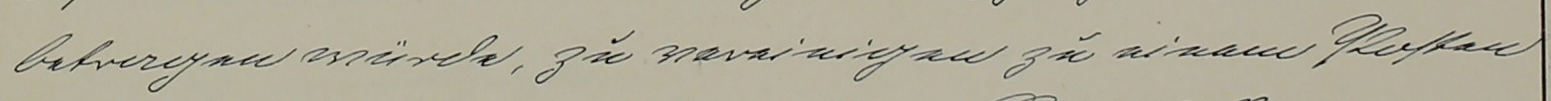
betragen würde, zu vereinigen zu einem Posten
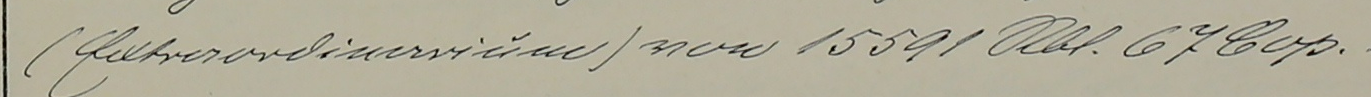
(Extraordinarium) von 15591 Rbl. 67 Cop.
